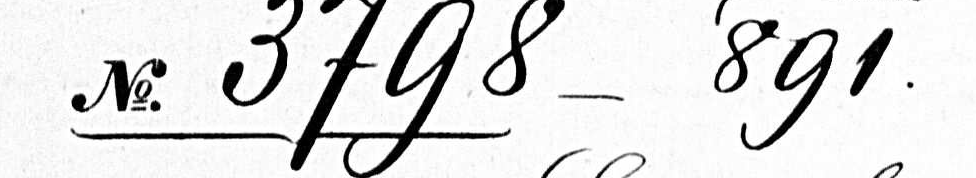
No. 3798 - 1891
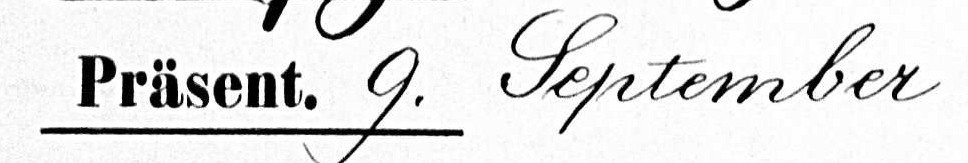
Präsent. 9. September
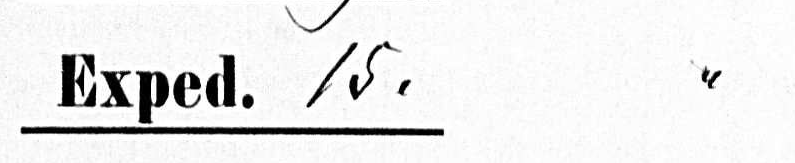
Exped. 15. „
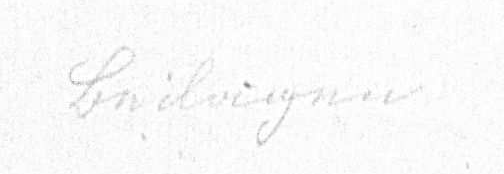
Beilagen
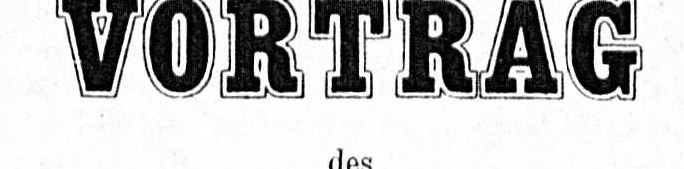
VORTRAG
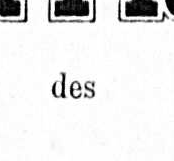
des
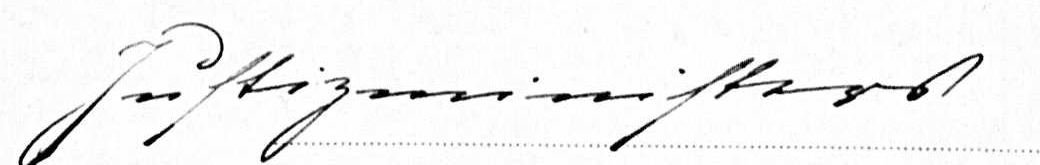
Justizministers
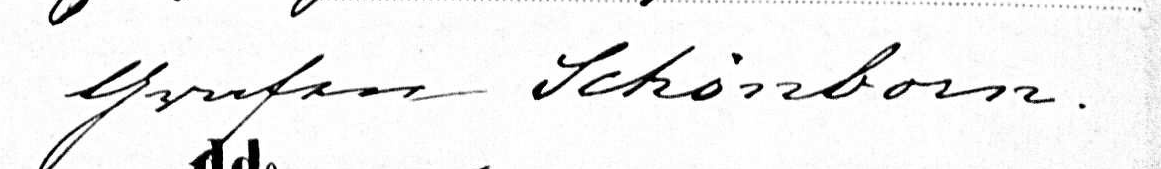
Grafen Schönborn
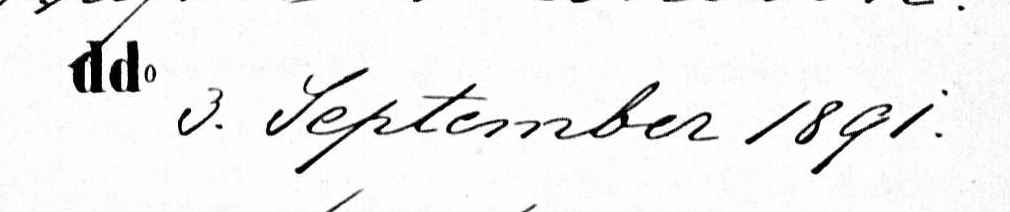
ddo 3. September 1891
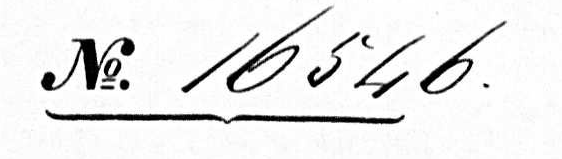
No. 16546
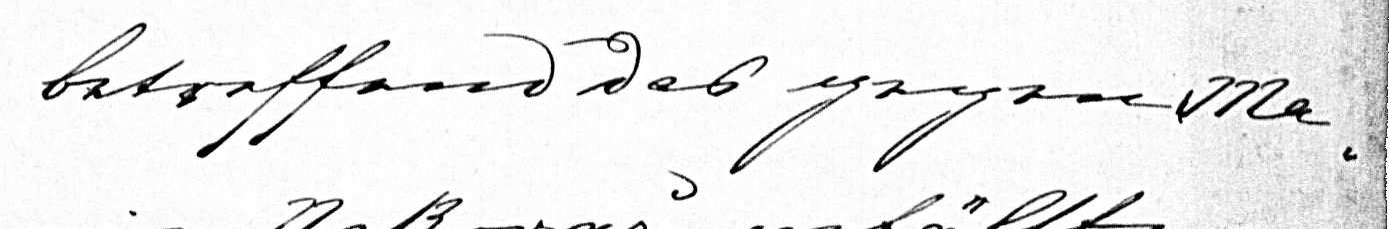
Betreffend das gegen Ma¬
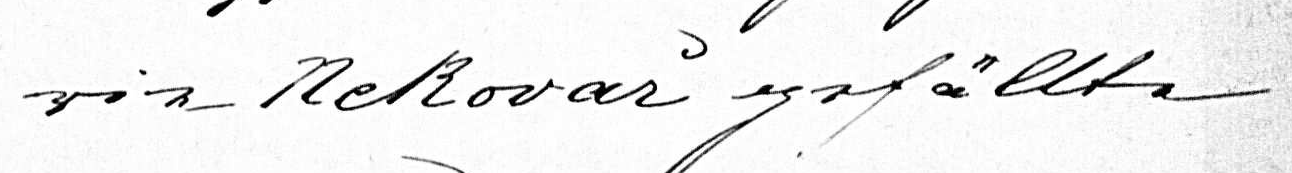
rie Nekovař gefällte
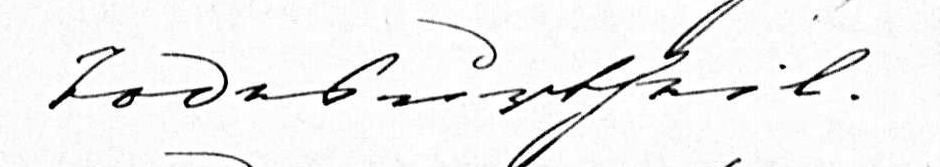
Todesurtheil.
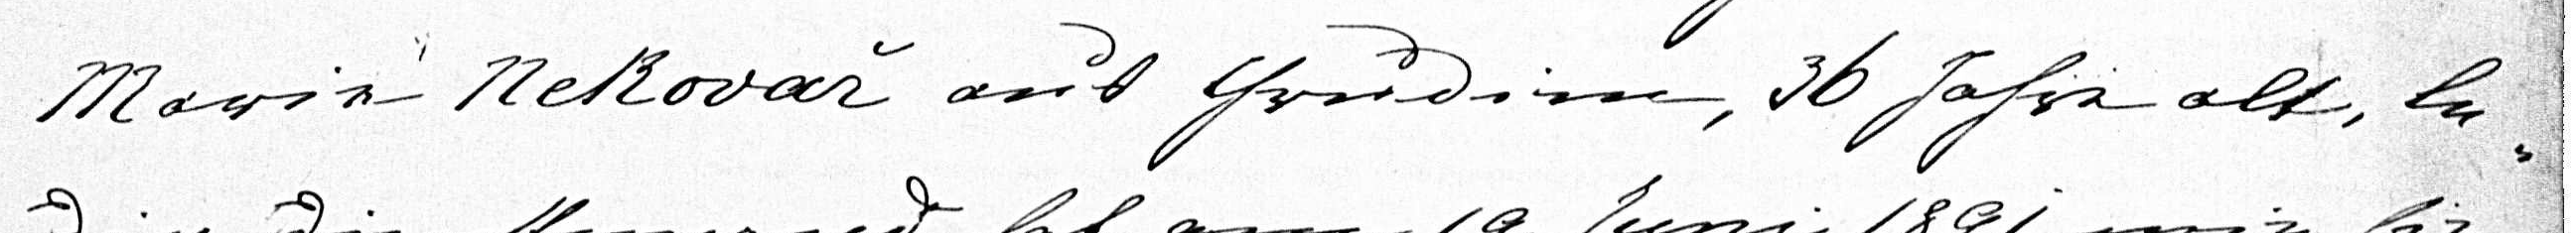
Marie Nekovař aus Chrudim, 36 Jahre alt, le¬
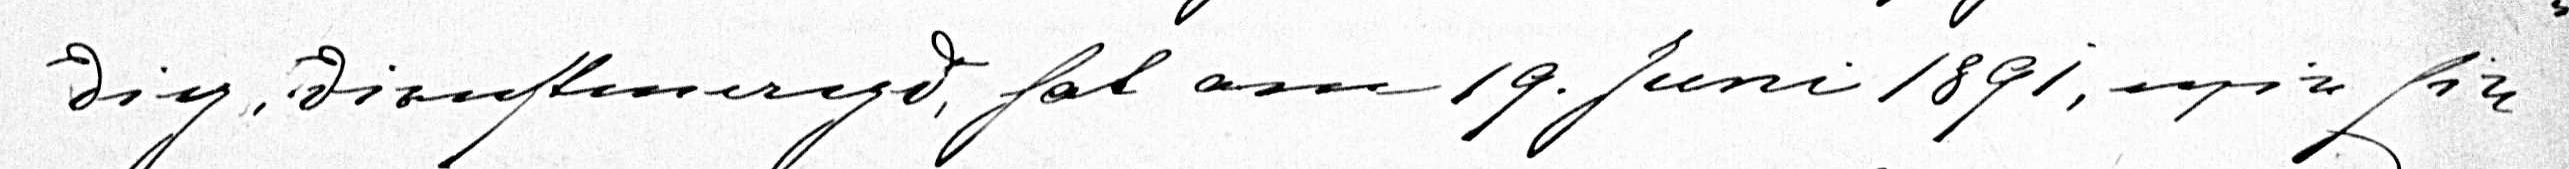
dig, Dienstmagd, hat am 19. Juni 1891, wie sie
